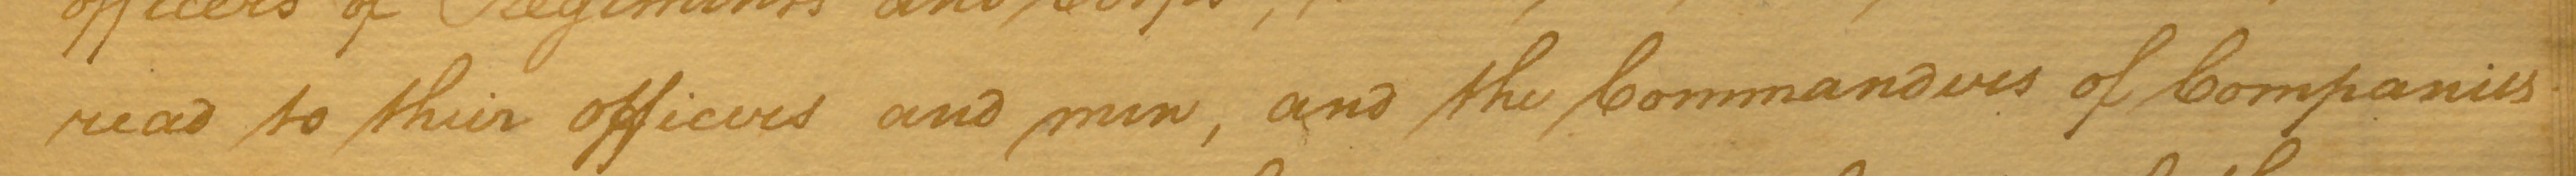read to their officers and men, and the Commanders of Companies
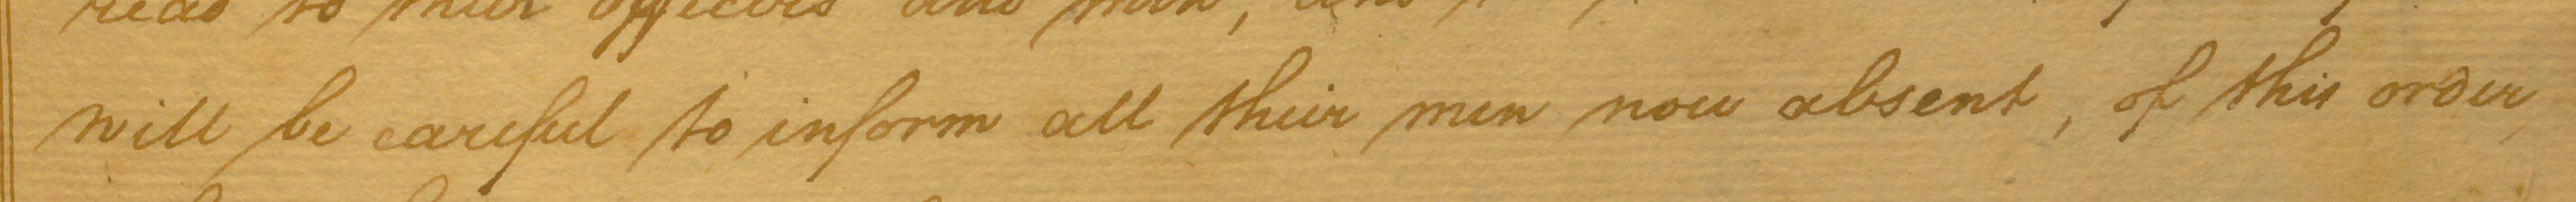will be careful to inform all their men now absent, of this order
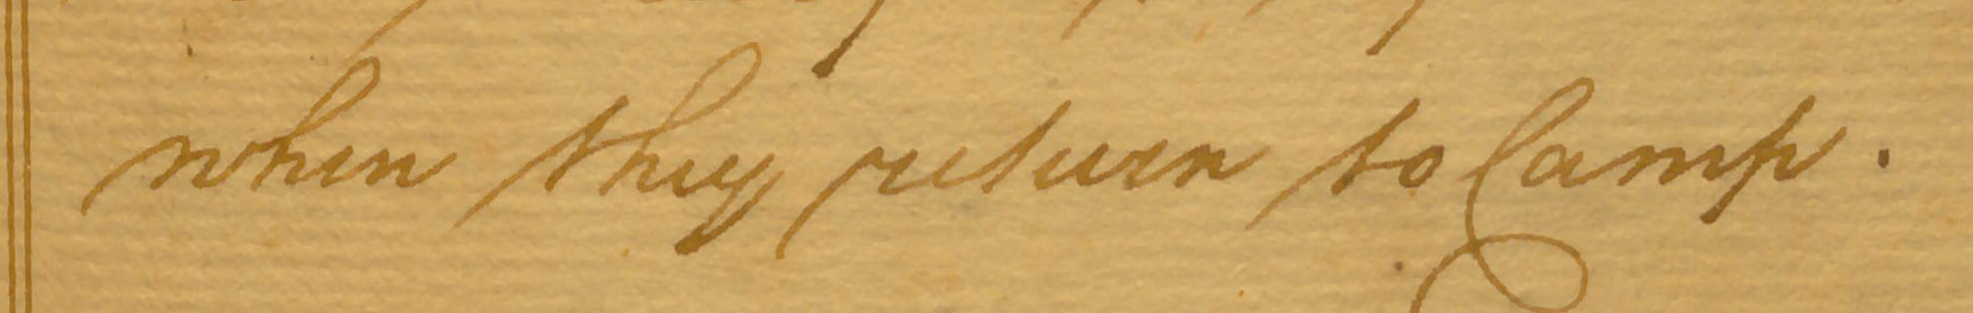when they return to Camp.
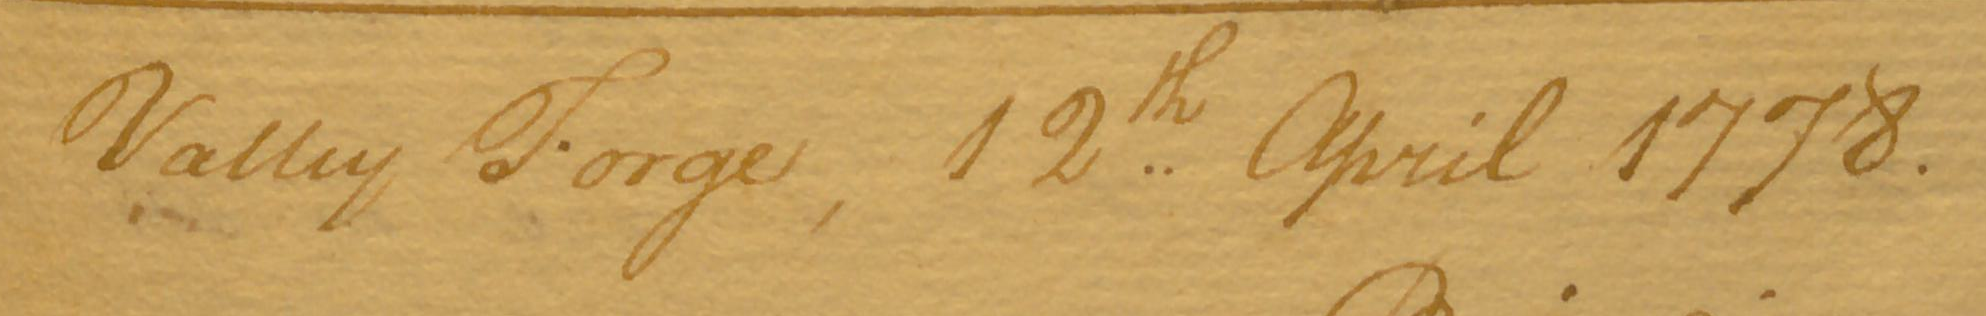Valley Forge, 12^th. April 1778.
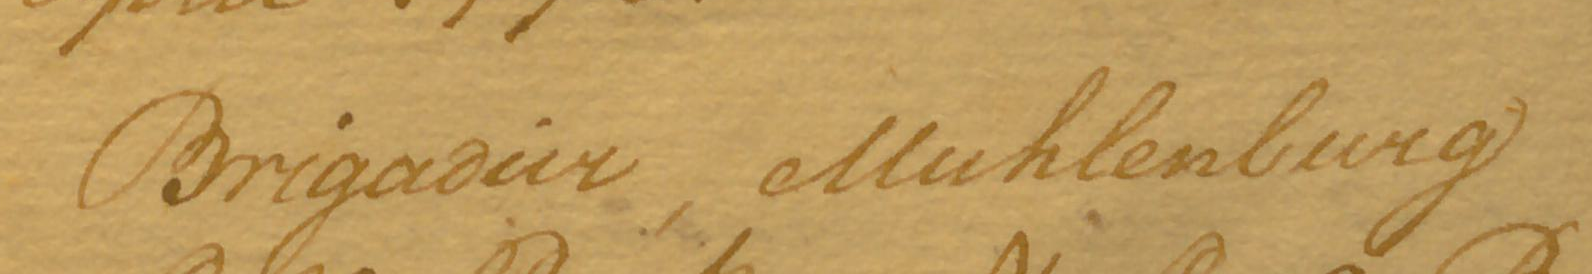Brigadier Muhlenburg
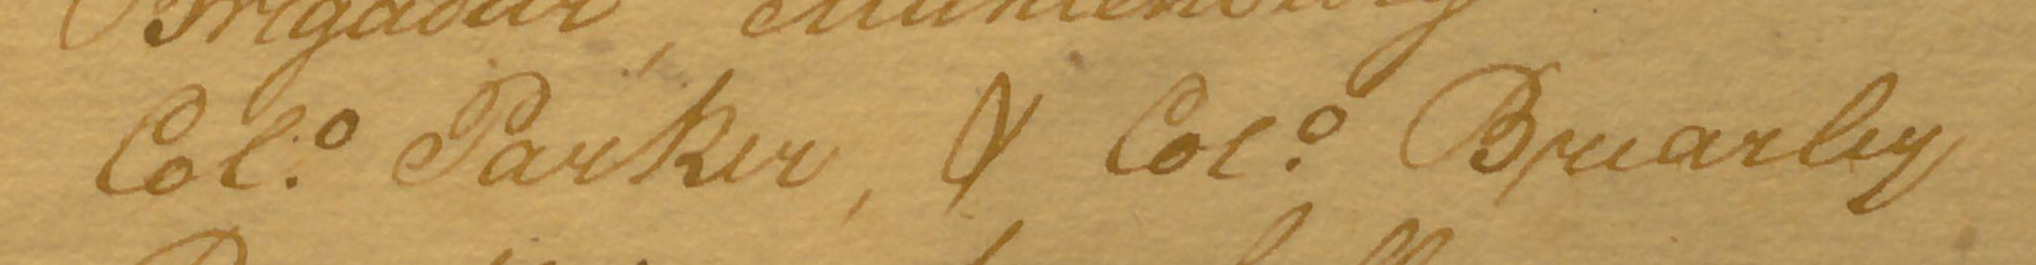Col^o. Parker, & Col^o. Briarley
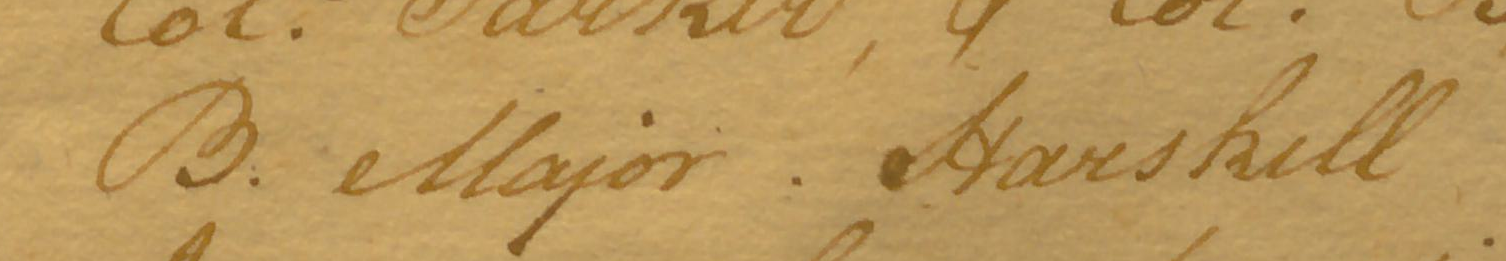B. Major Harskill
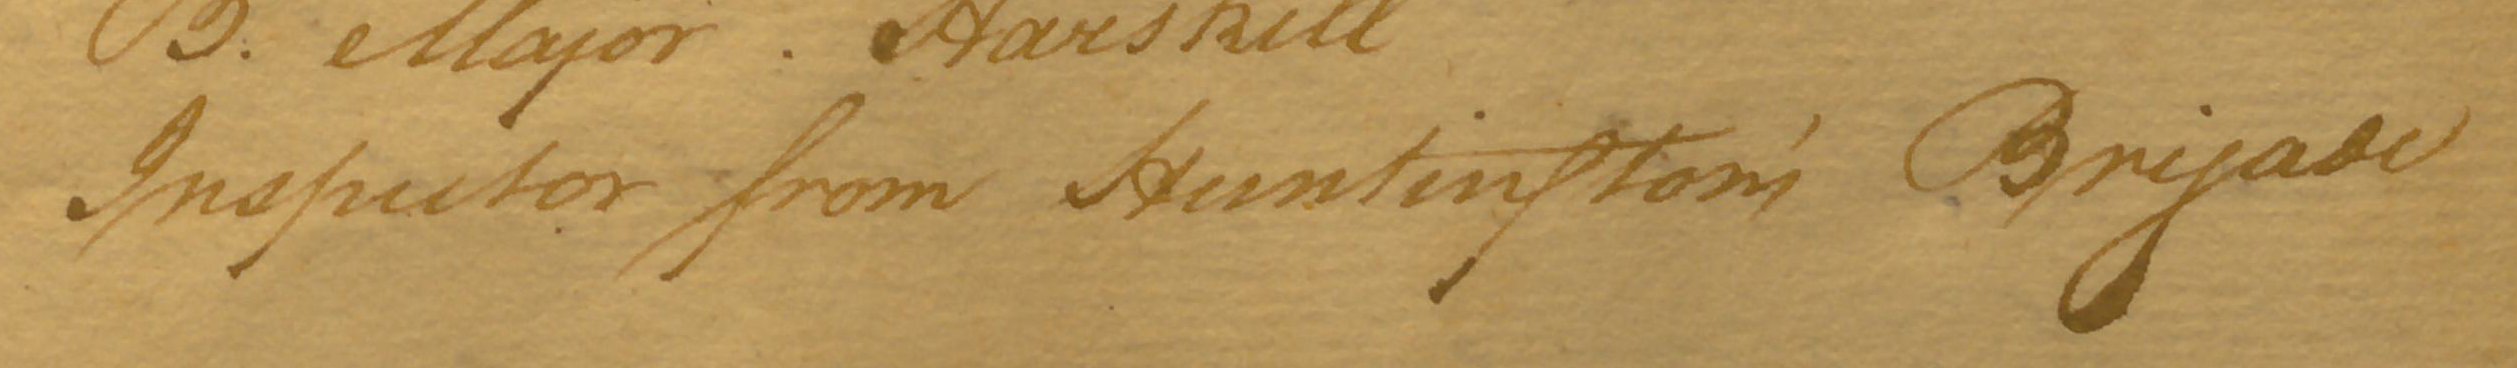Inspector from Huntington's Brigade
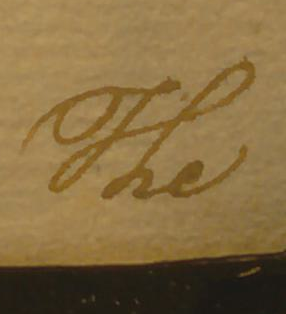The
